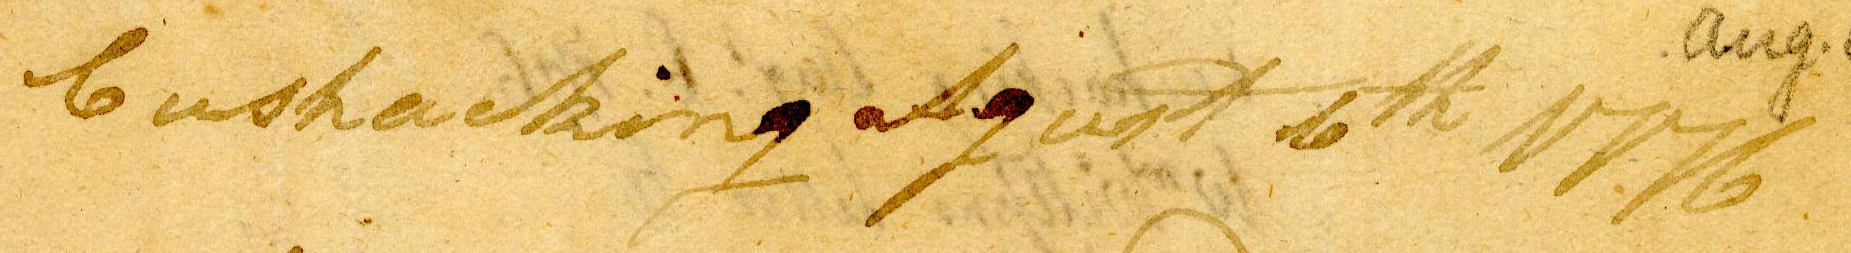Cushacking Agust 6th 1776
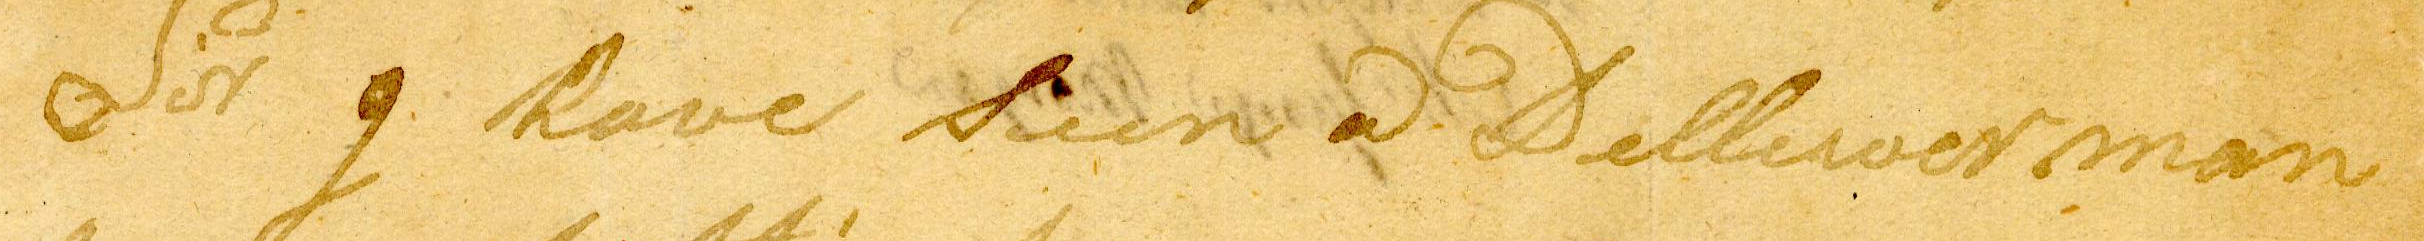Sir I have Seen a Delliwer man
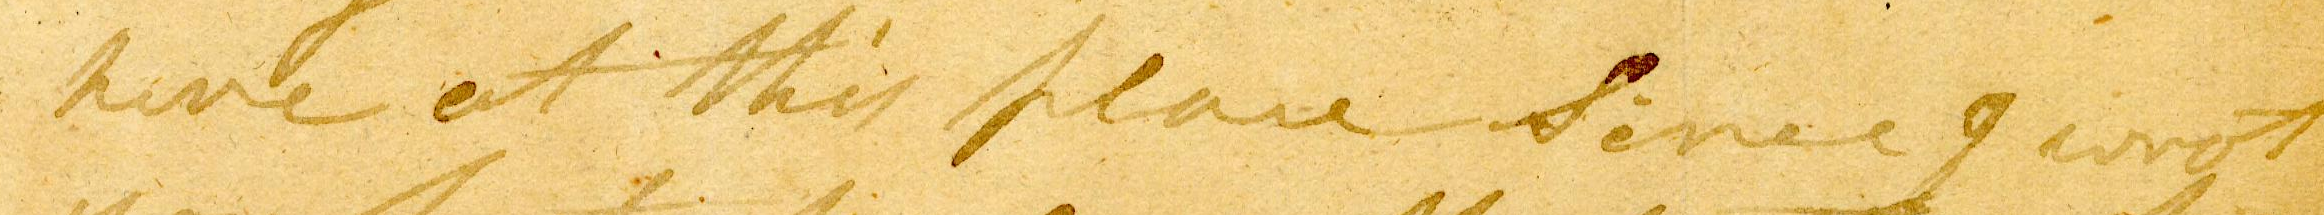here at this place since I wrot
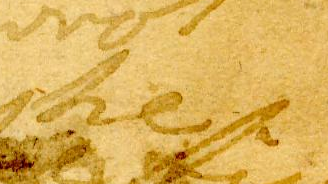he
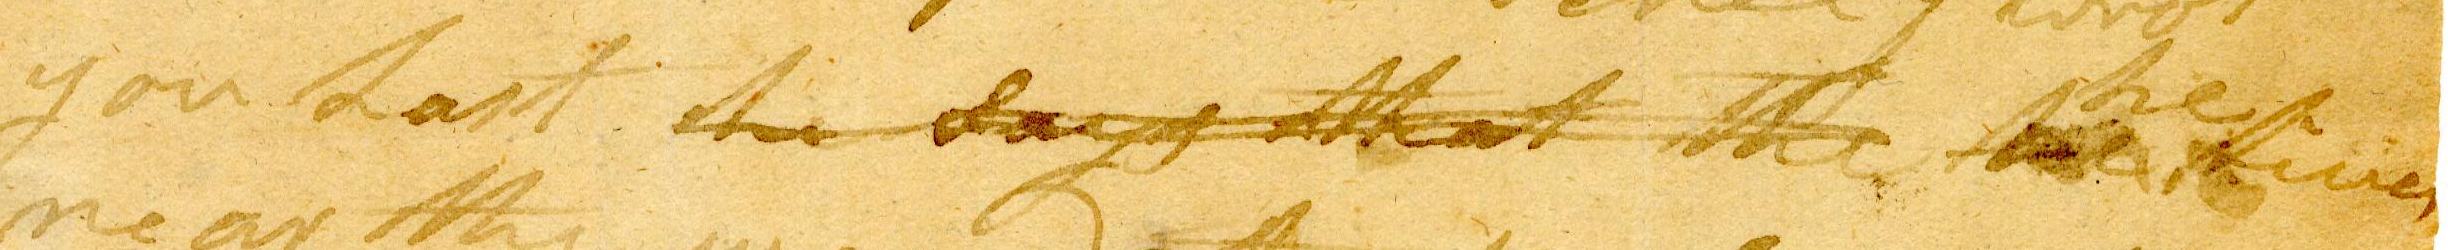you Last. [he says that the] [he] Lives
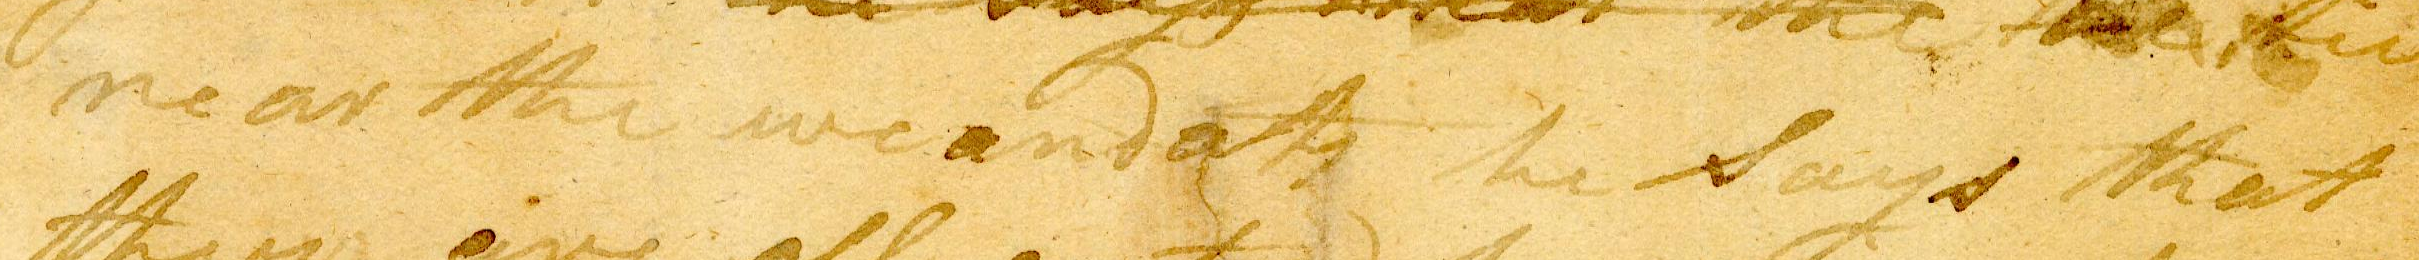near the weandatts he says that
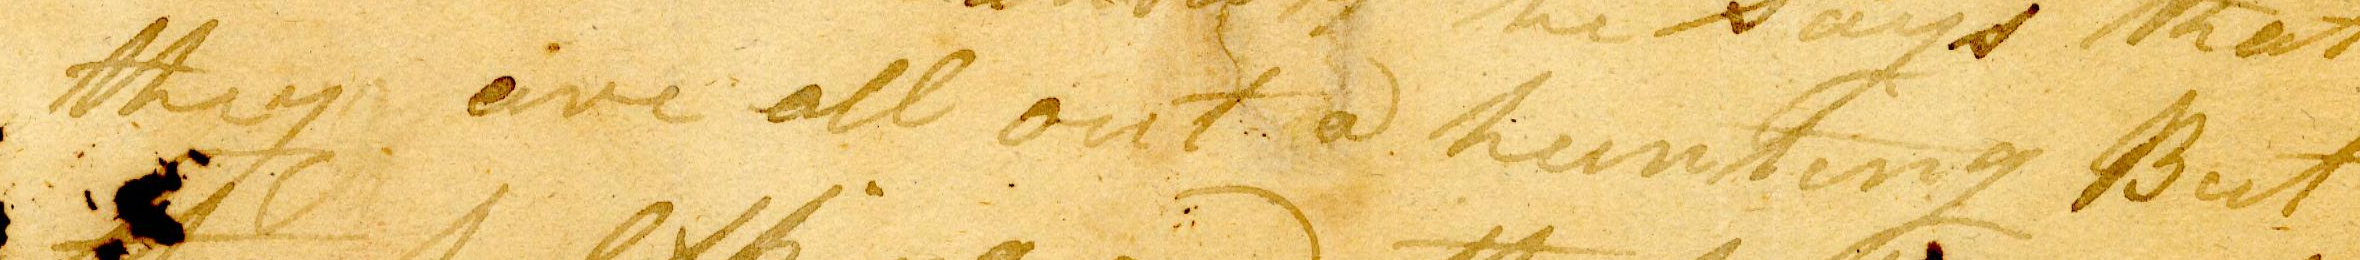they are all out a hunting But
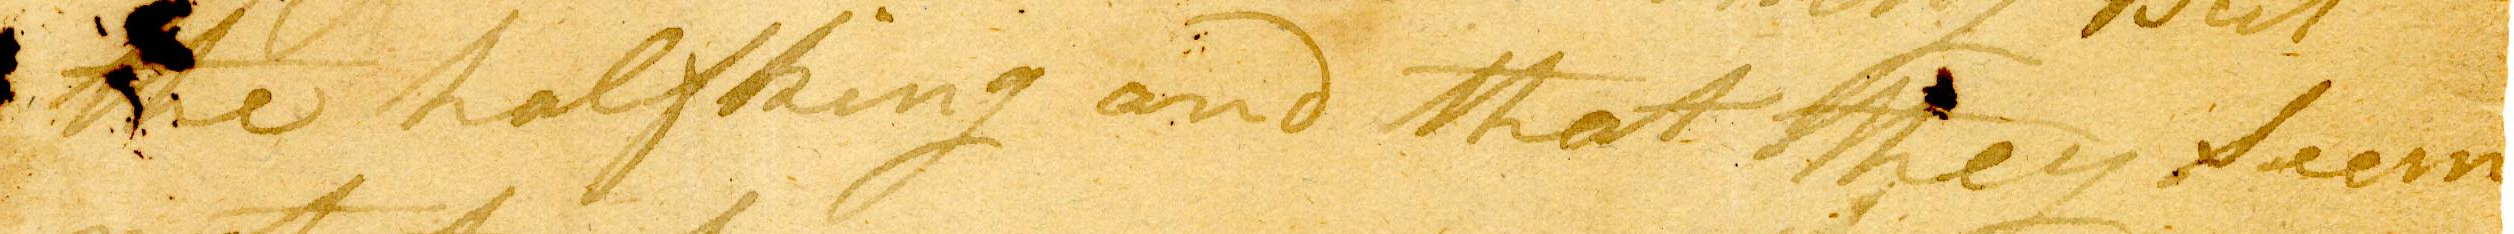the halfking and that they Seem
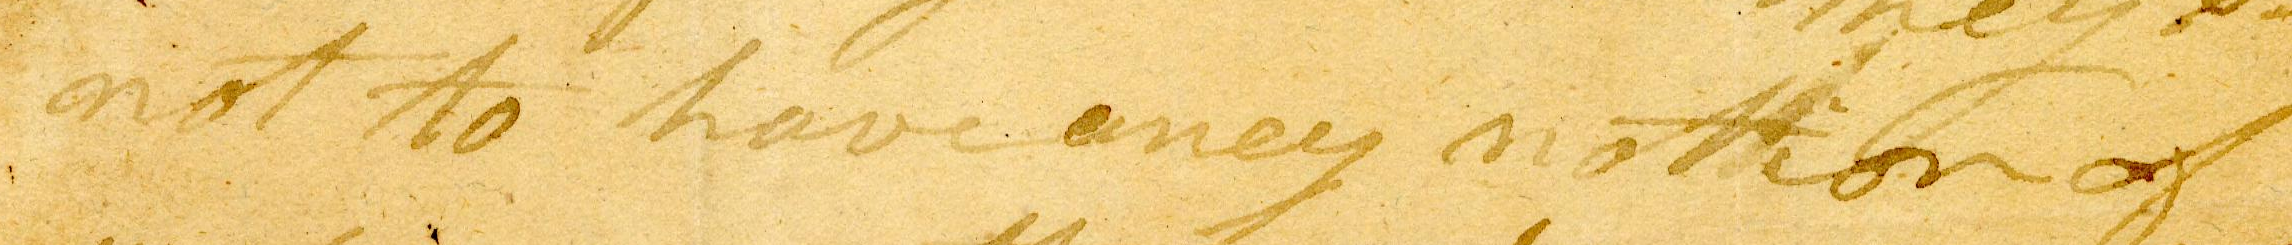not to have aney notion of
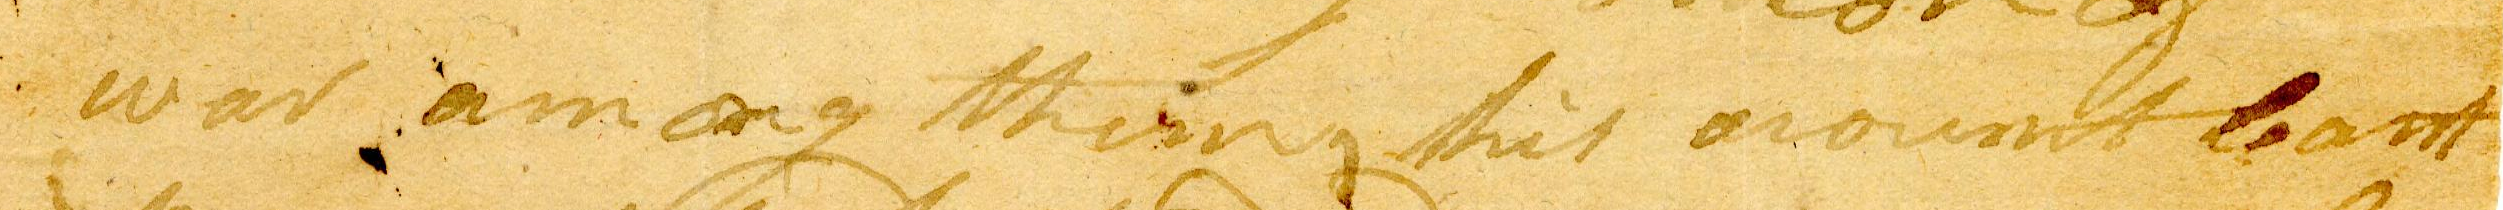war among them, this acount cant
